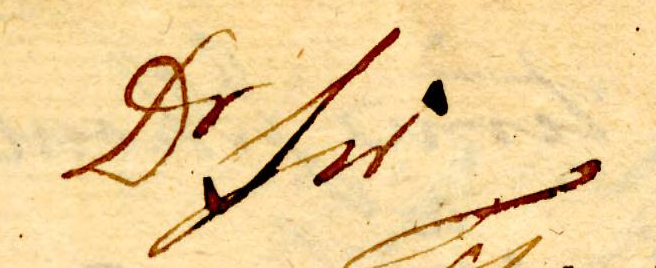D^r Sir
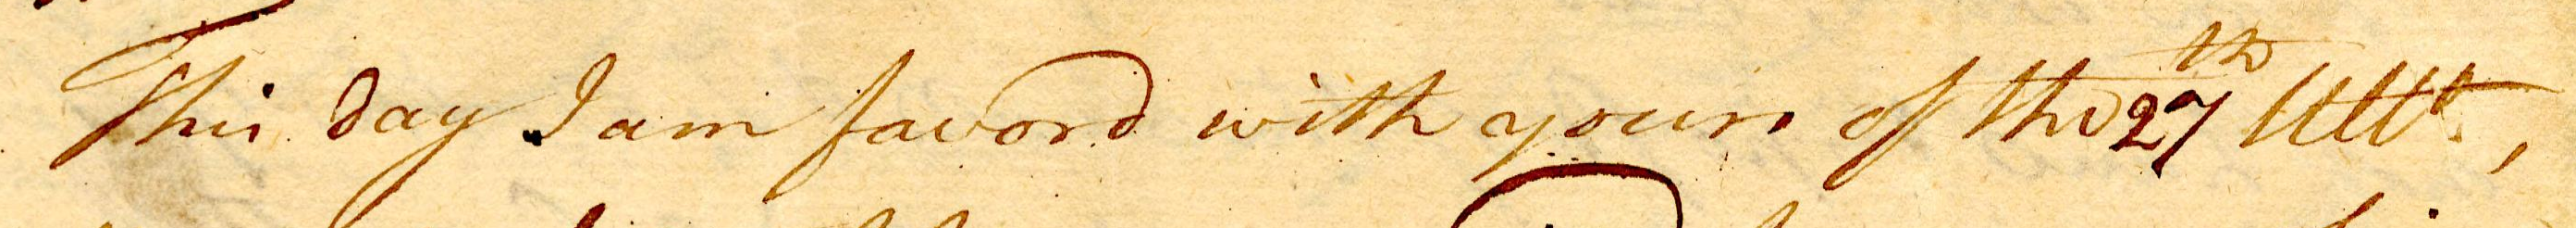This day I am favord with yours of the 29^th Aug^t
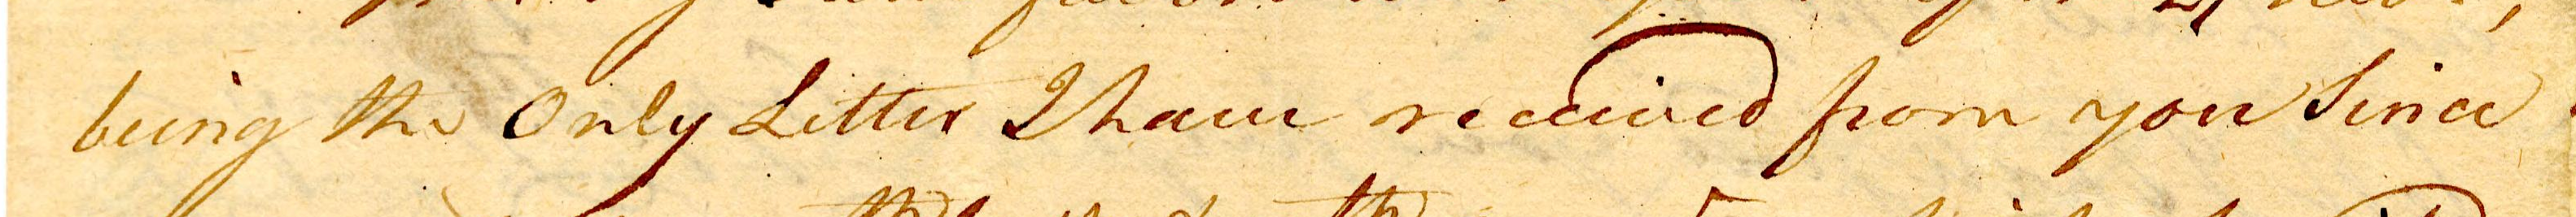being the Only Letter I have received from you Since
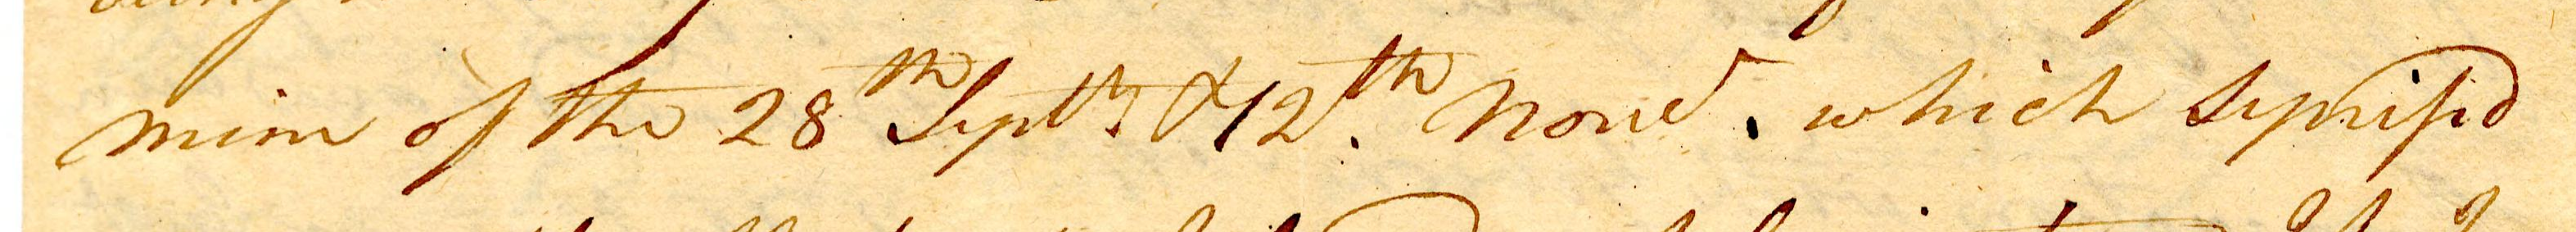mine of the 20^th Sept^r. & 12^th. Nove^r, which sepris'd
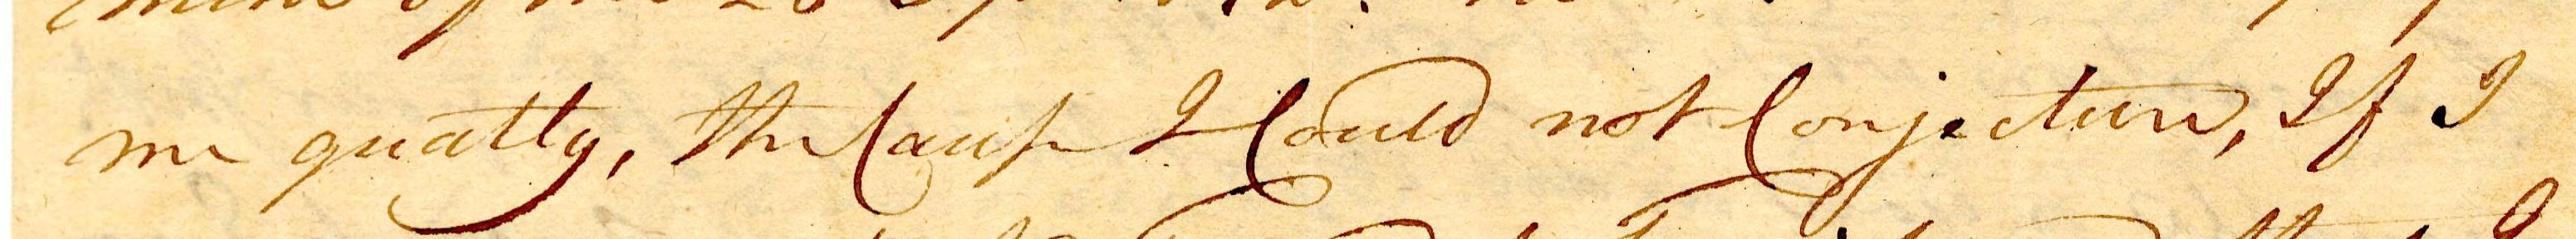me greatly, the Cause I Could not Conjecture, If I
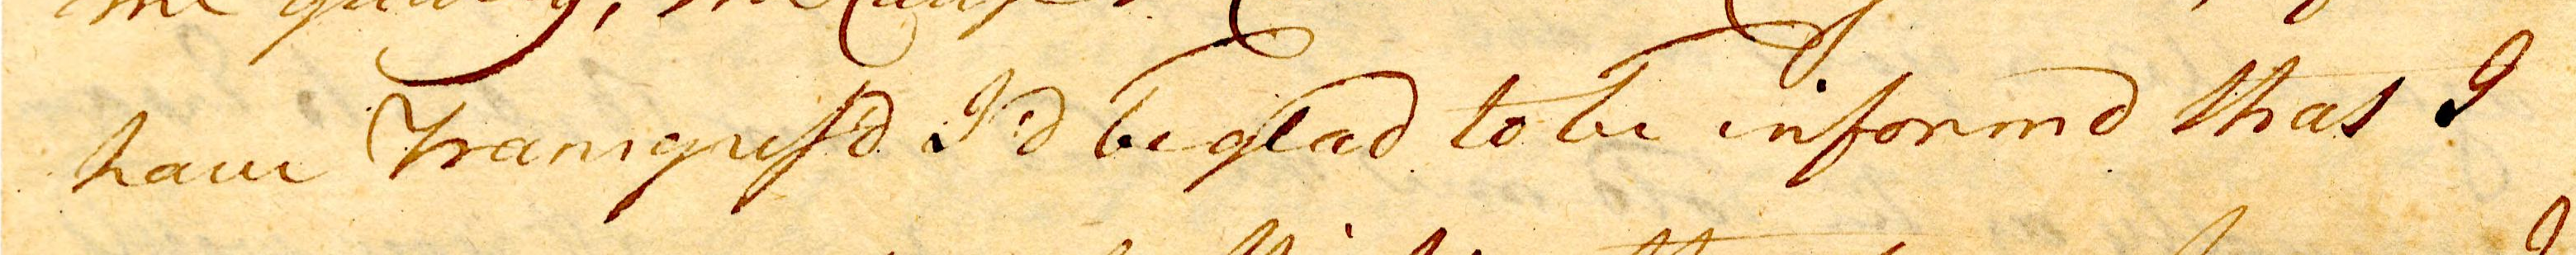have transgres'd I'd be glad to be informd that I
